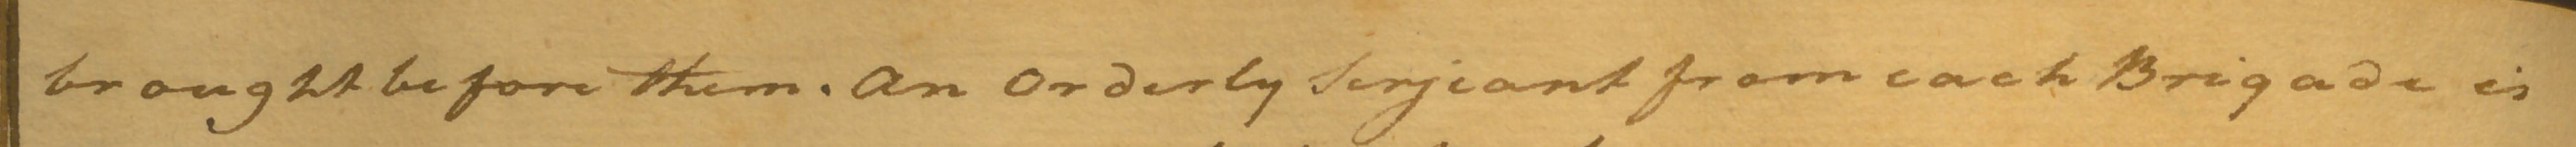brought before them. An Orderly Serjeant from each Brigade is
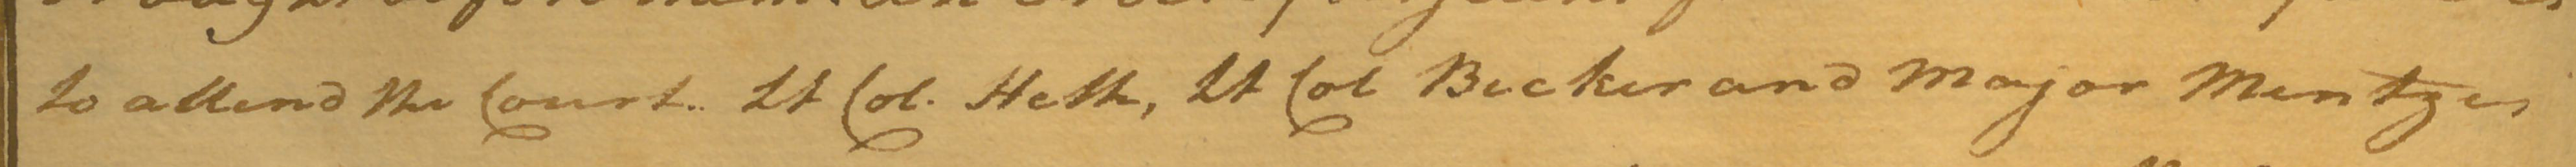to attend the Court. Lt Col. Heth, Lt Col Bucker and Major Mentzes
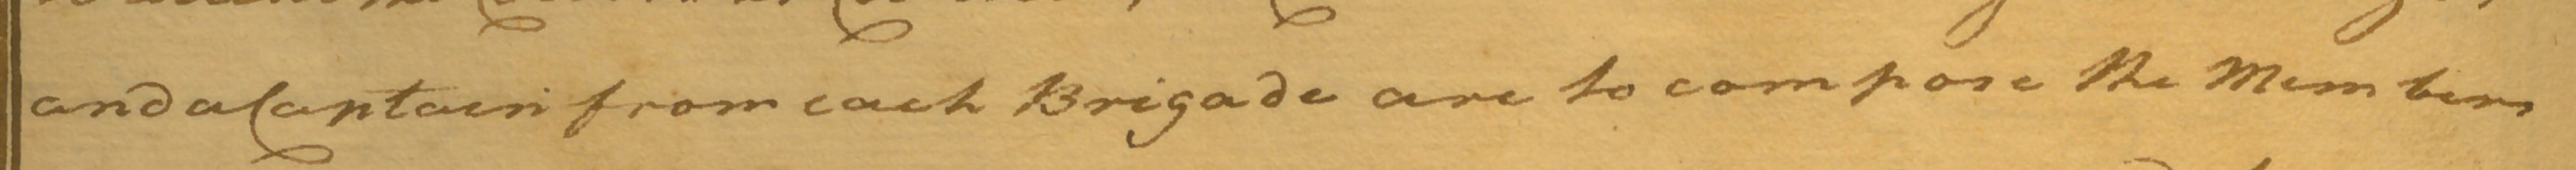and a Captain from each Brigade are to compose the Members
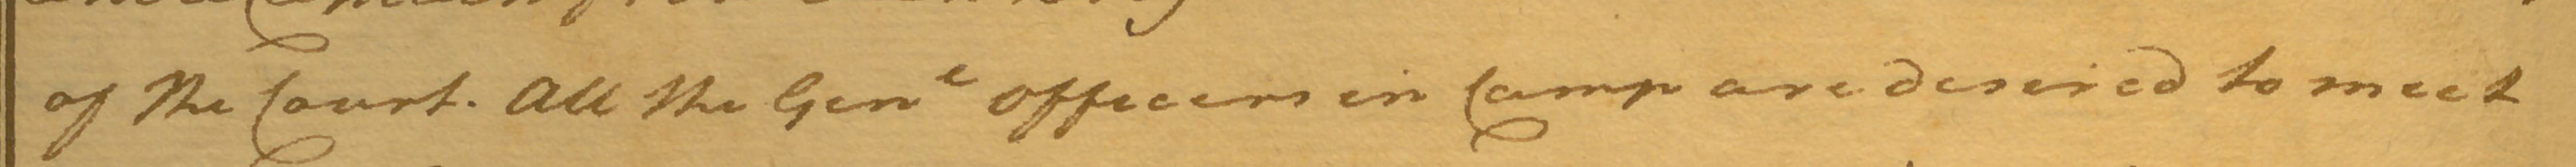of the Court. All the Gen^l officers in Camp are desired to meet
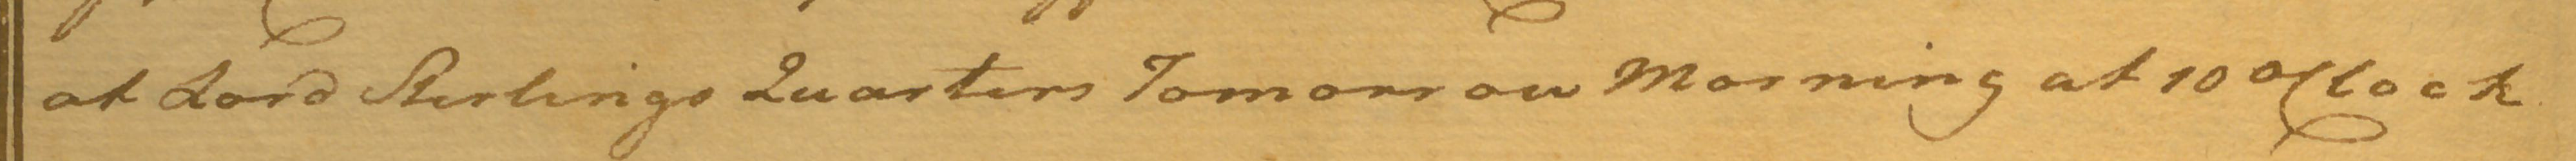at Lord Sterlings Quarters Tomorrow Morning at 10 ^oClock
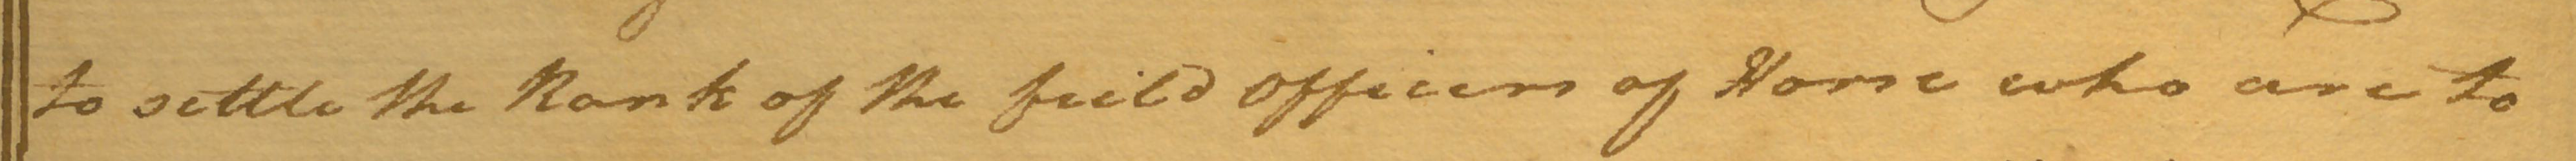to settle the Rank of the field officers of Horse who are to
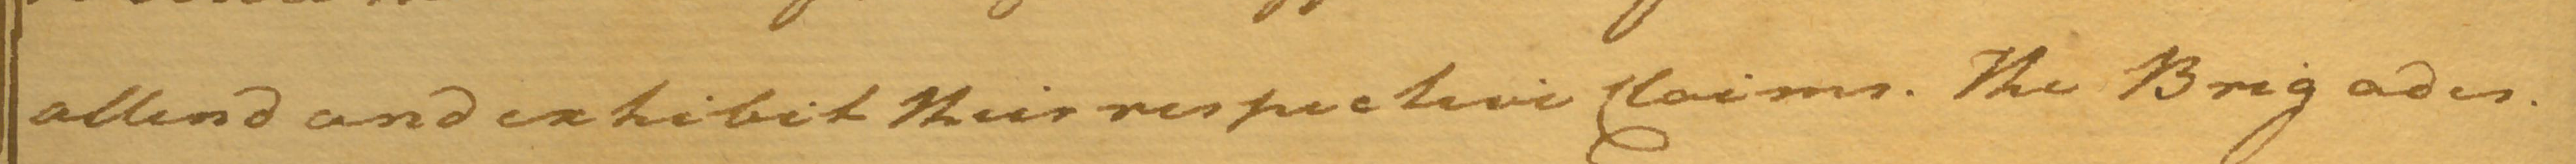attend and exhibit their respective Claims. The Brigades
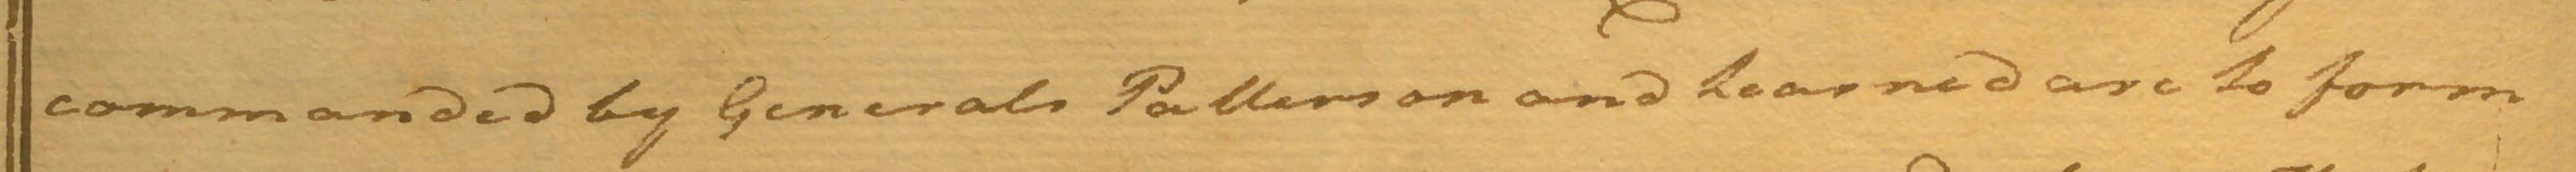commanded by Generals Patterson and Learned are to form
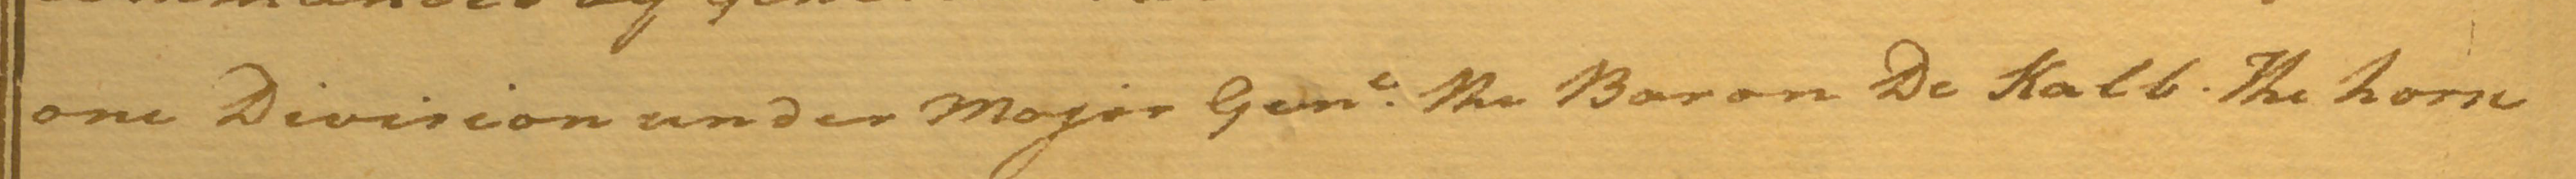one Division under Major Gen^l. the Baron De Kalb. The horse
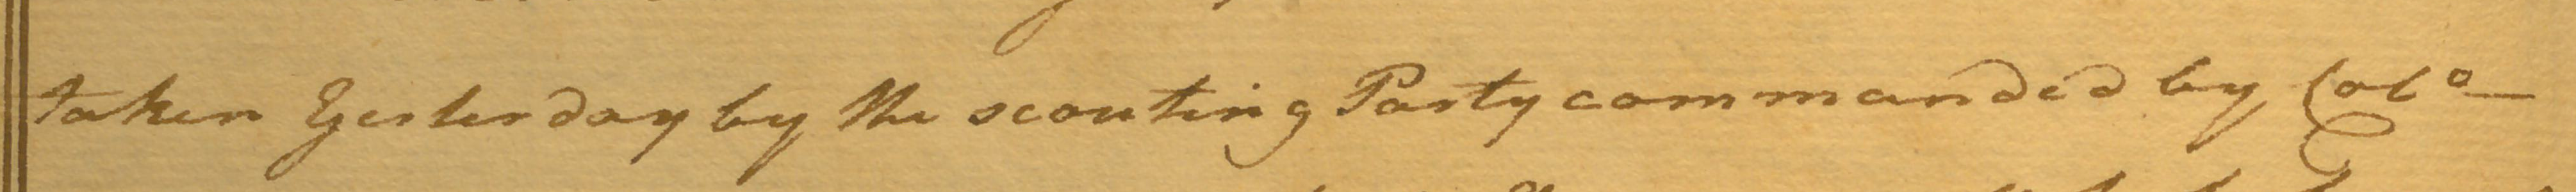taken Yesterday by the scouting Party commanded by Col^o-
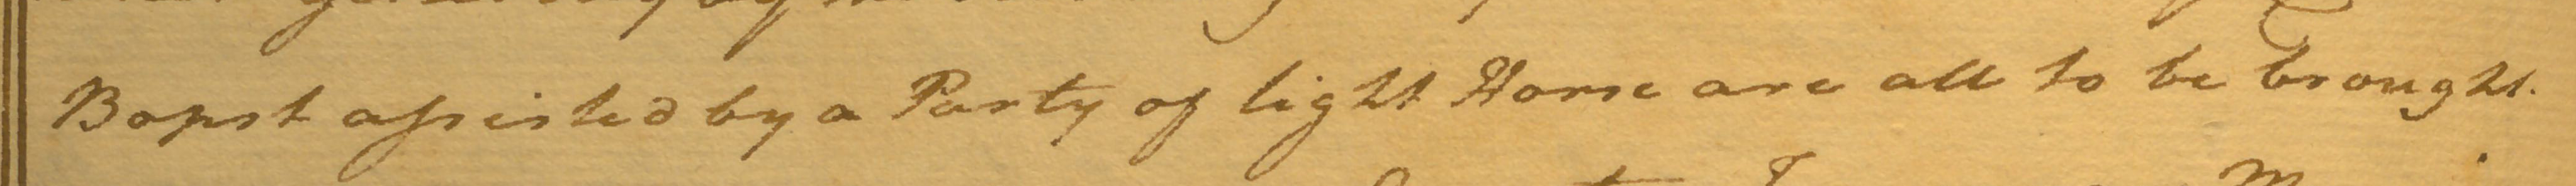Barst assisted by a Party of light Horse are all to be brought
